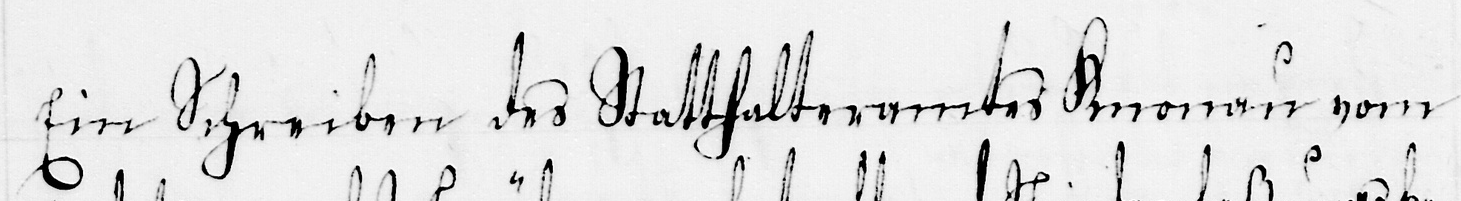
Ein Schreiben des Statthalteramtes Knonau vom
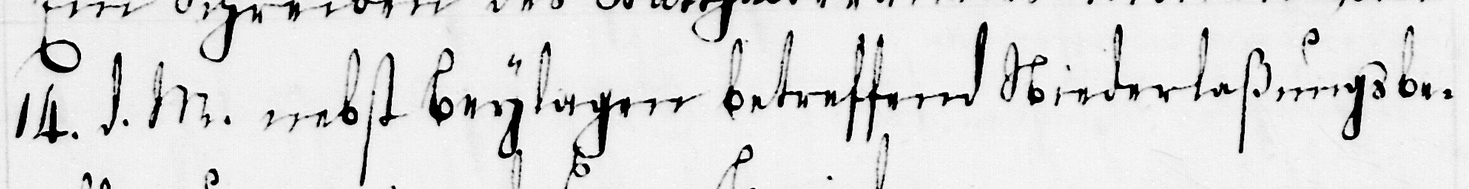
14. d. M. nebst Beylagen betreffend Niederlaßungsbe¬
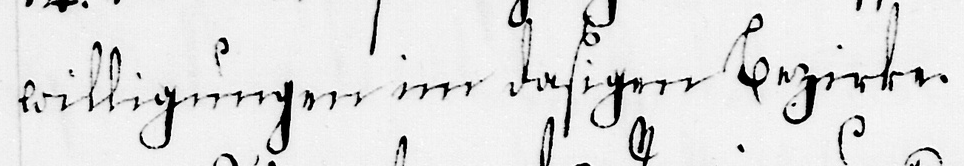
willigungen im dasigen Bezirke.
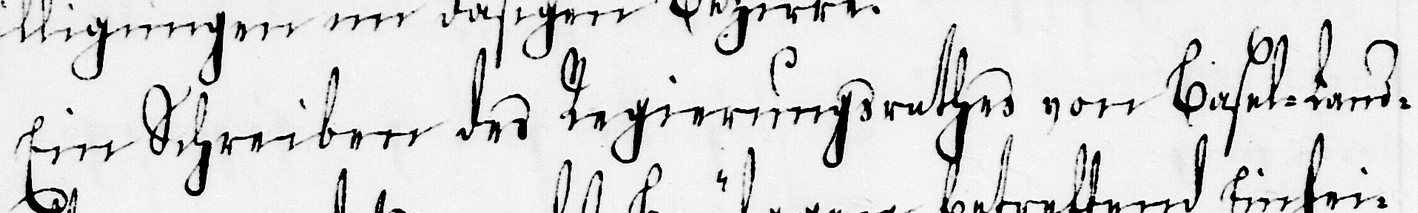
Ein Schreiben des Regierungsrathes von Basel-Land¬
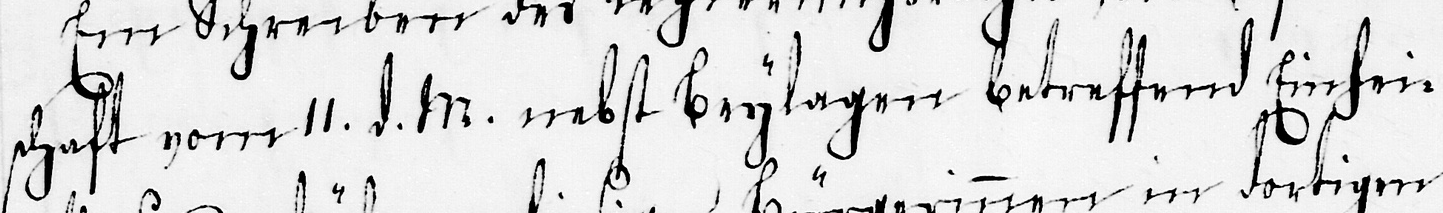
schaft vom 11. d. M. nebst Beylagen betreffend Einhei¬
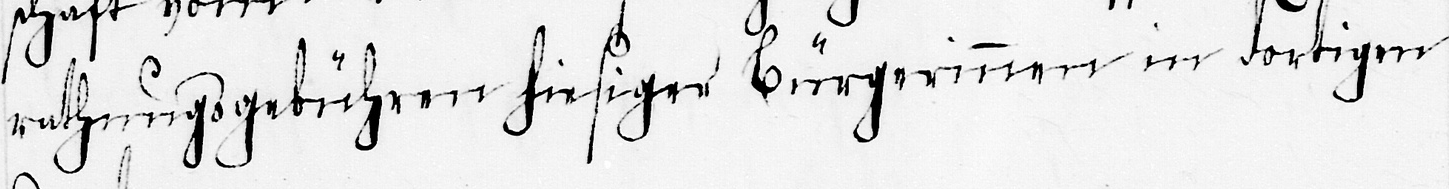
rathungsgebühren hiesiger Bürgerinnen in dortigen
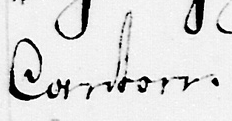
Canton.
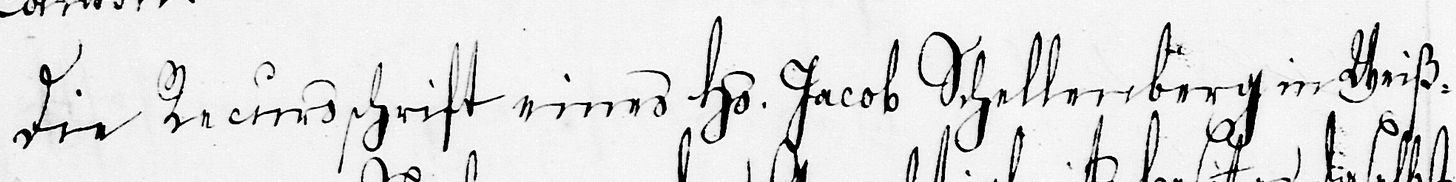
Die Recursschrift eines Hs. Jacob Schellenberg in Weiß¬
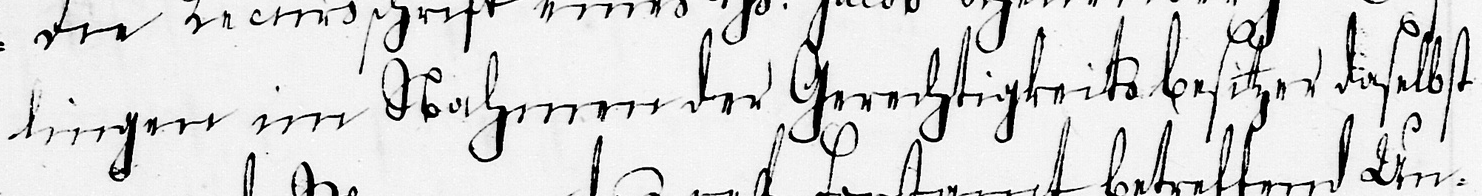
lingen im Nahmen der Gerechtigkeitsbesitzer daselbst
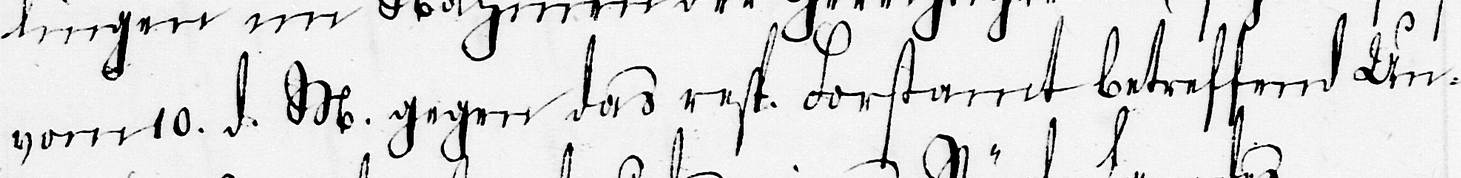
vom 10. d. M. gegen das resp. Forstamt betreffend Un¬
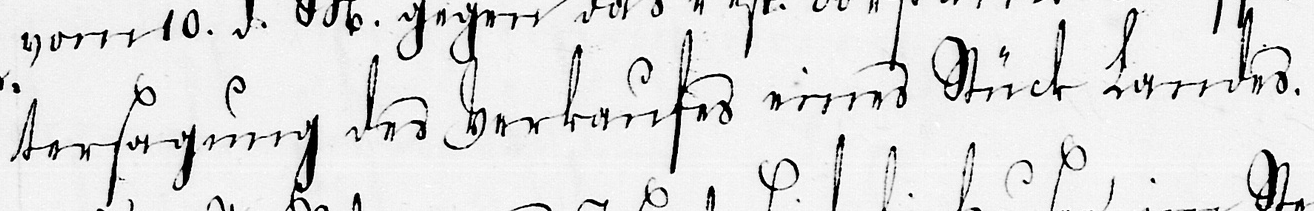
tersagung des Verkaufes eines Stück Landes.
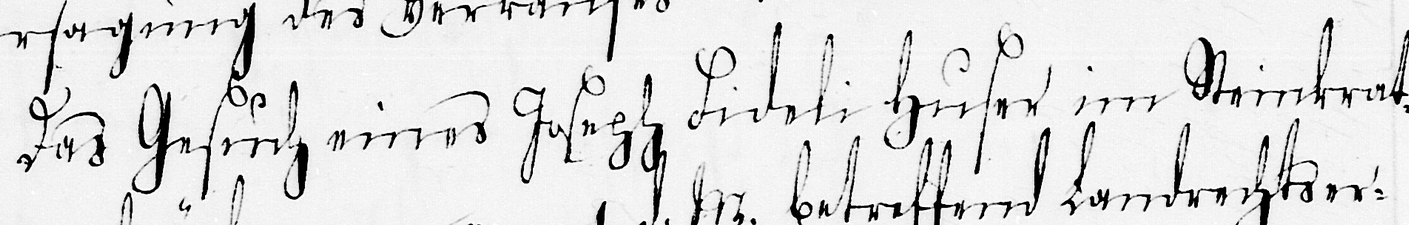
Das Gesuch eines Joseph Fideli Huser im Steinkrat¬
